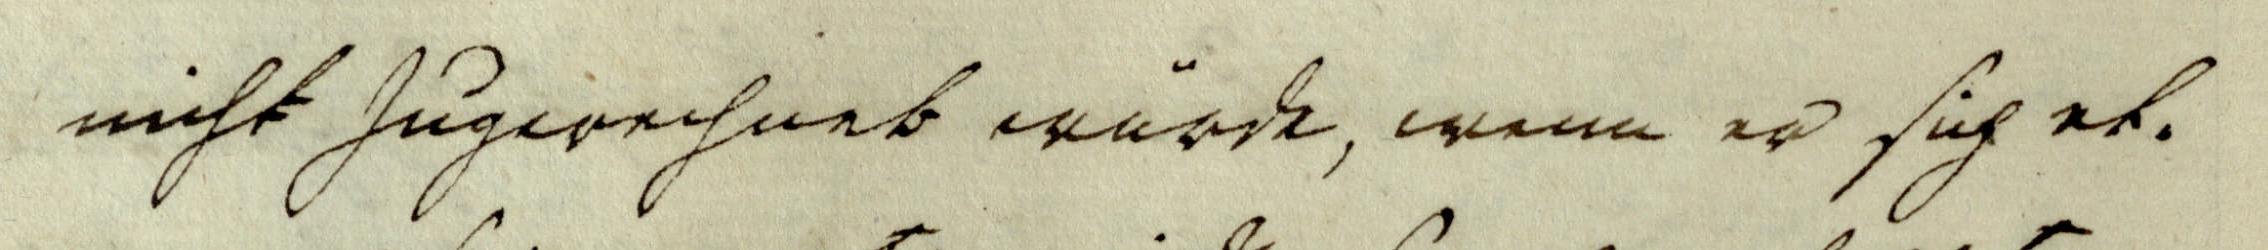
nicht zugerechnet würde, wenn er sich et¬
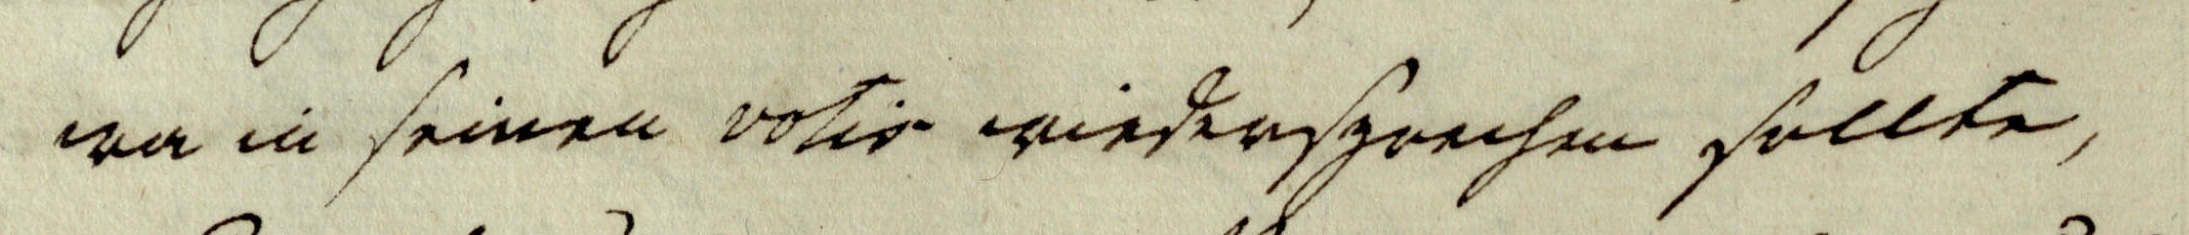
wa in seinen votis wiedersprechen sollte,
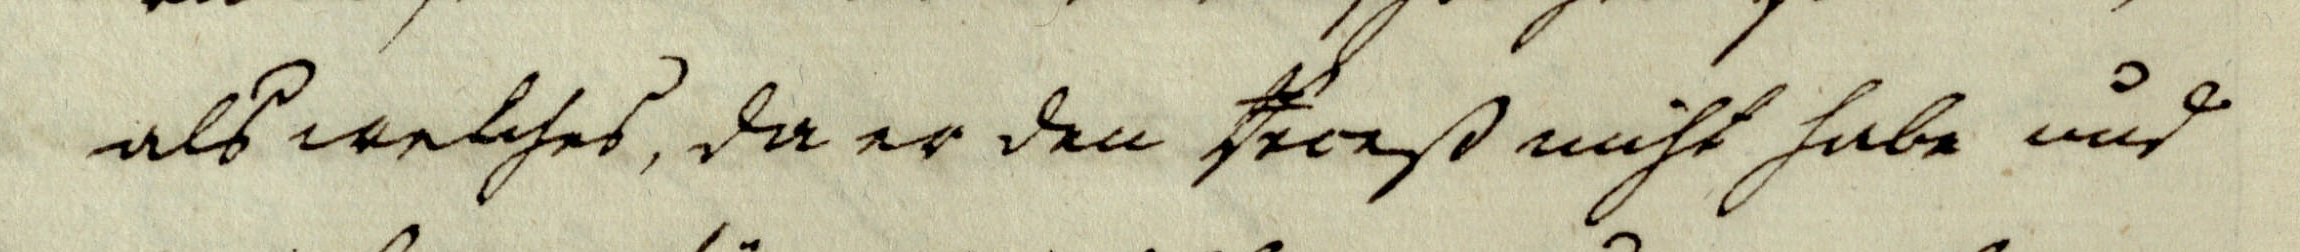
als welches, da er den Receß nicht habe und
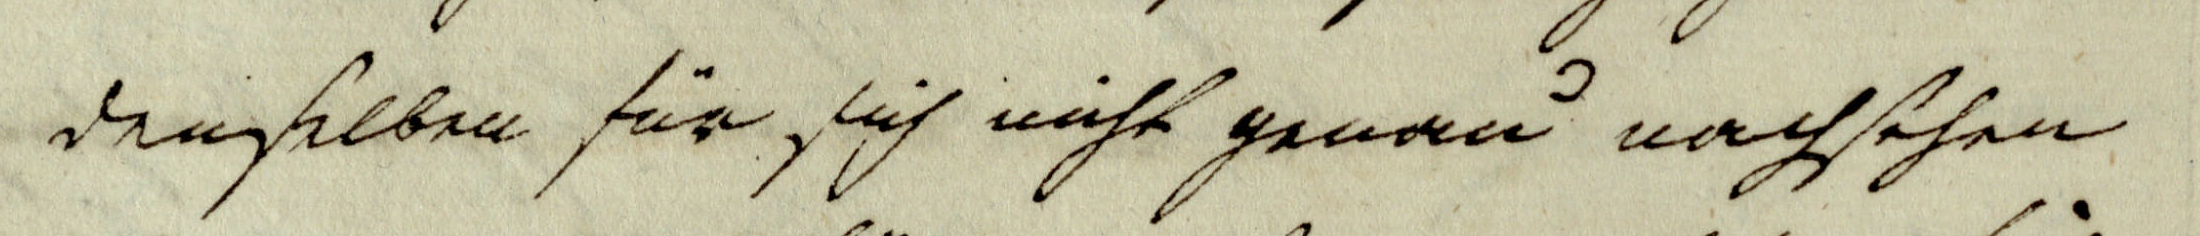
denselben für sich nicht genau nachsehen
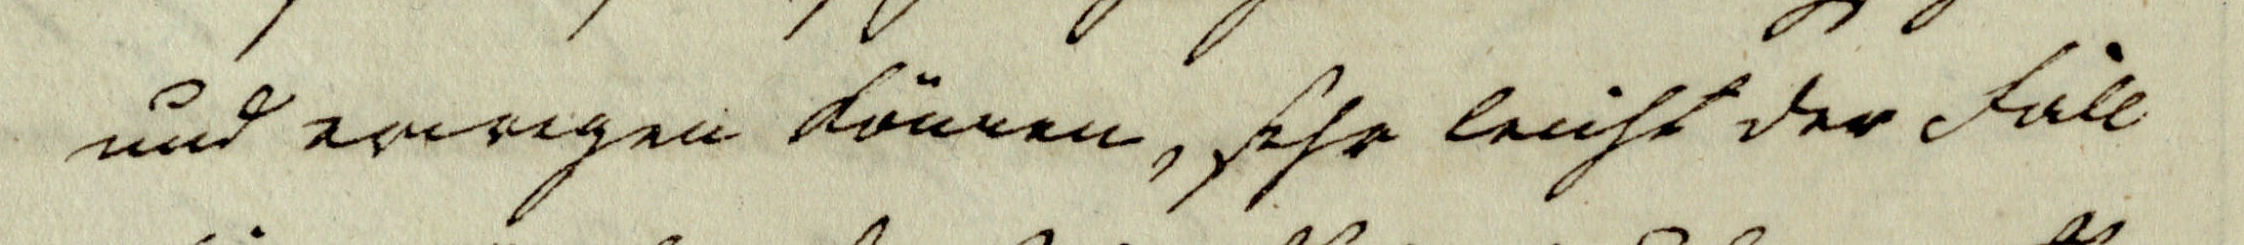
und erwegen können, sehr leicht der Fall
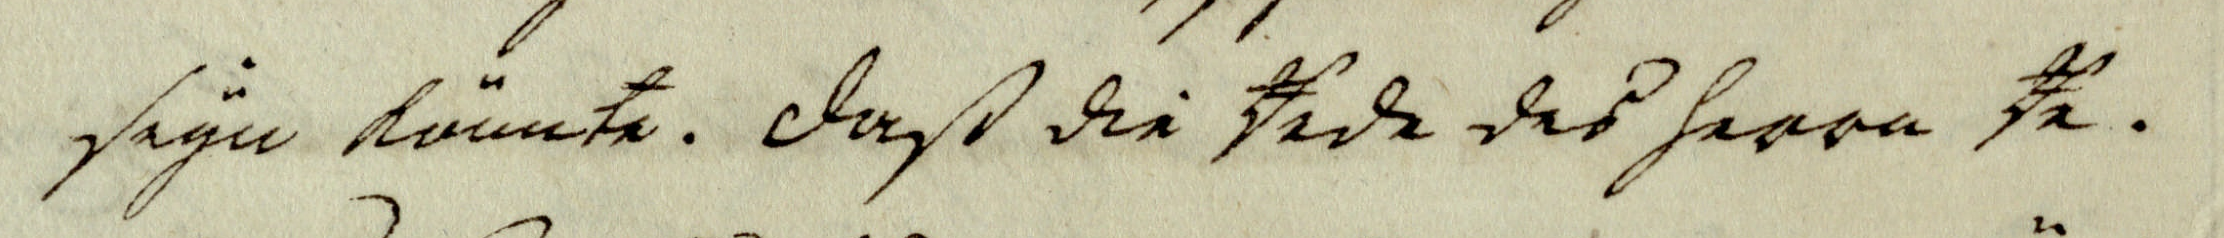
seÿn könnte. daß die Rede des Herrn Re¬
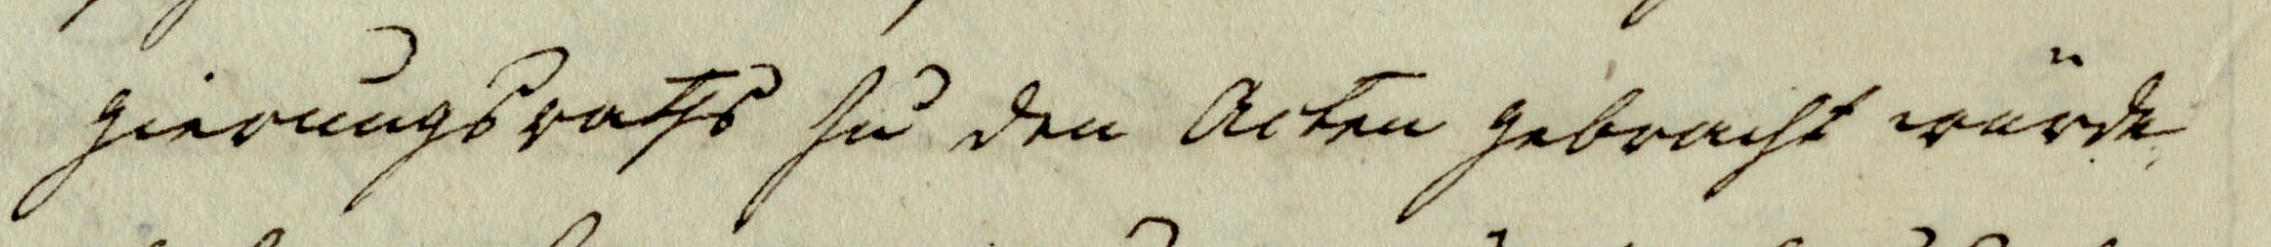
gierungsraths zu den Acten gebracht würde,
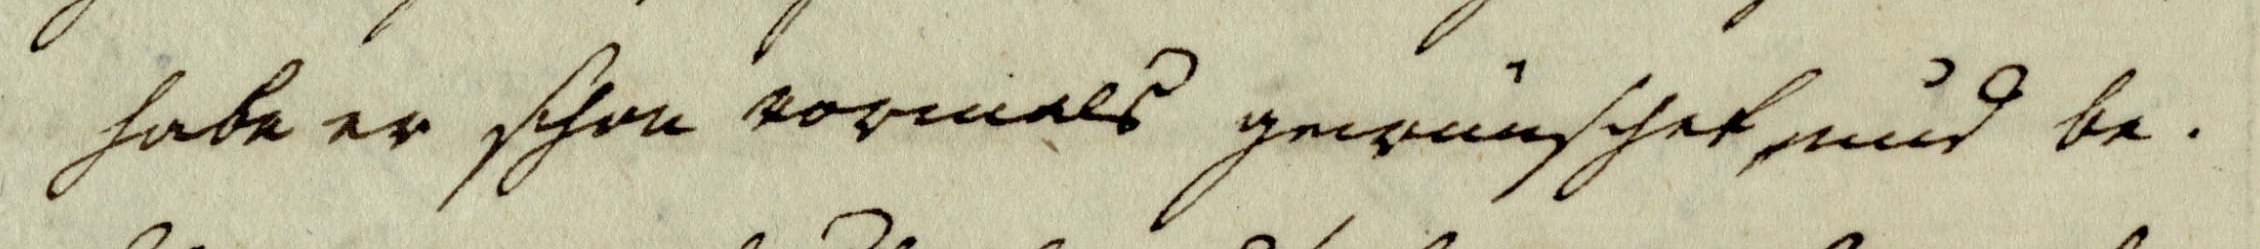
habe er schon vormals gewünschet und be¬
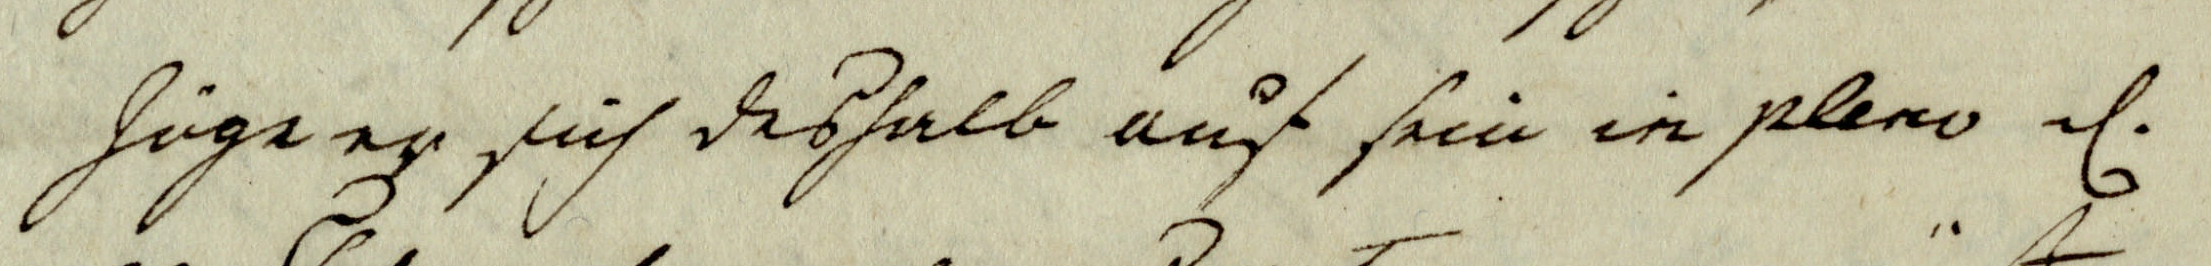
zöge er sich deshalb auf sein in pleno d.
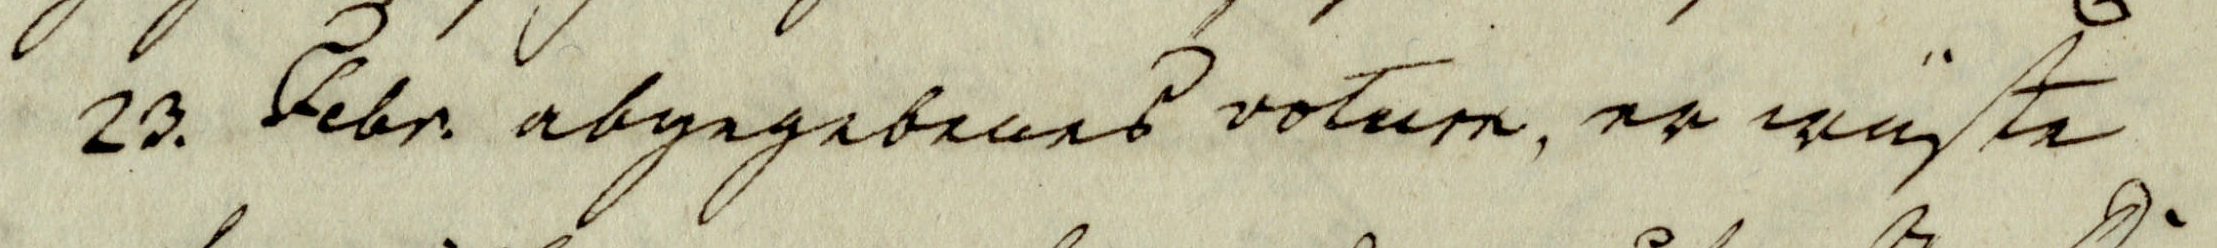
23. Febr. abgegebenes votum, er wüßte
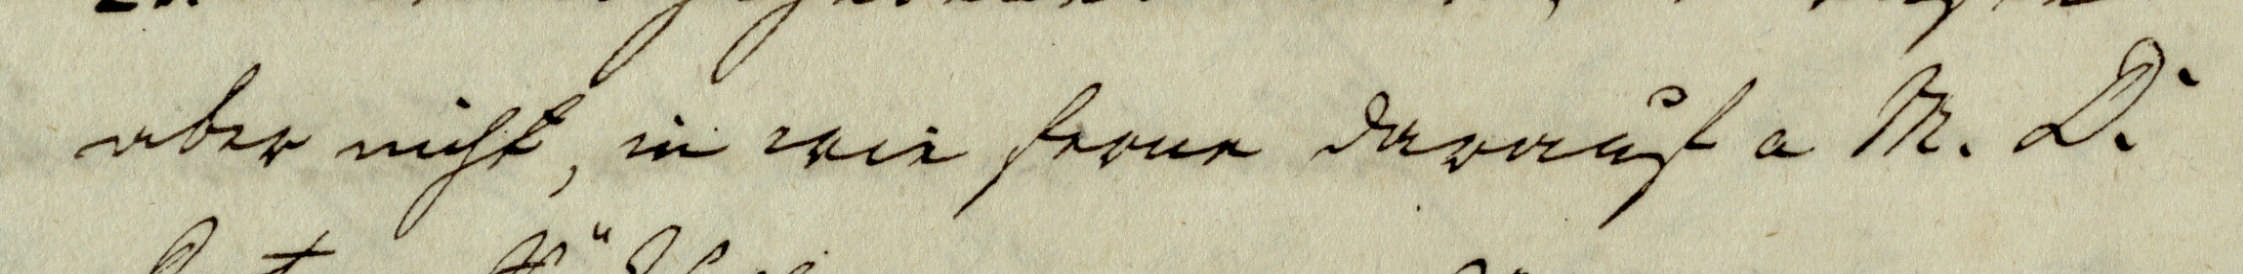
aber nicht, in wie ferne darauf a M. D.
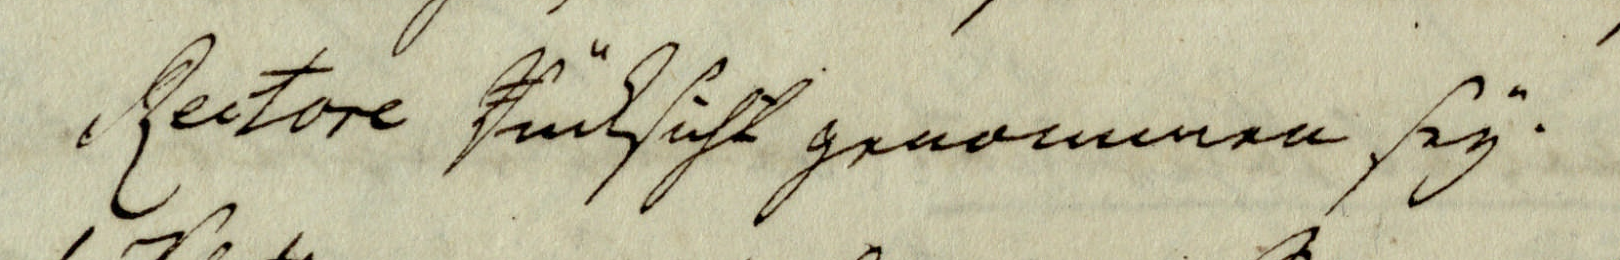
Rectore Rücksicht genommen seÿ.
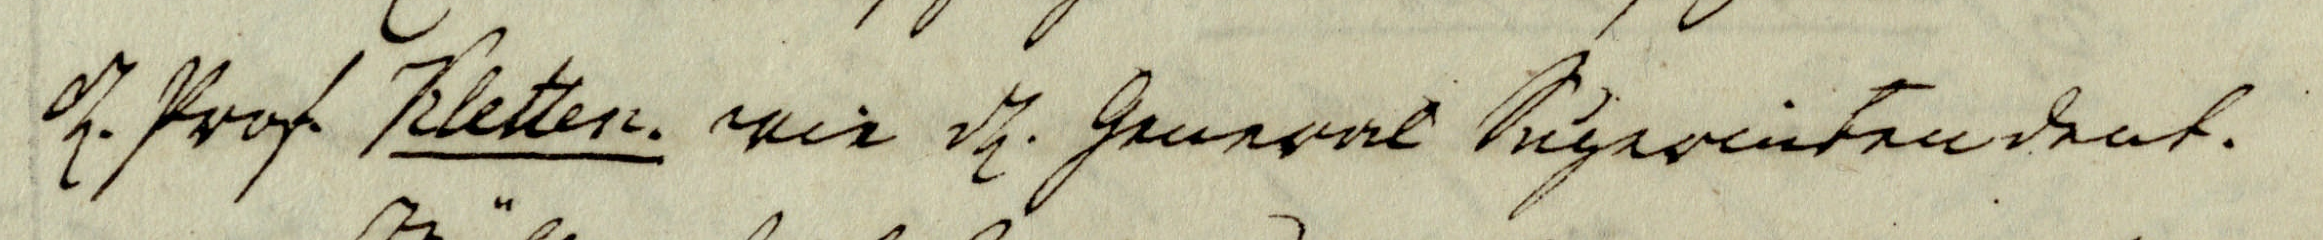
dh. Prof. Kletten. wie dh. General Superintendent.
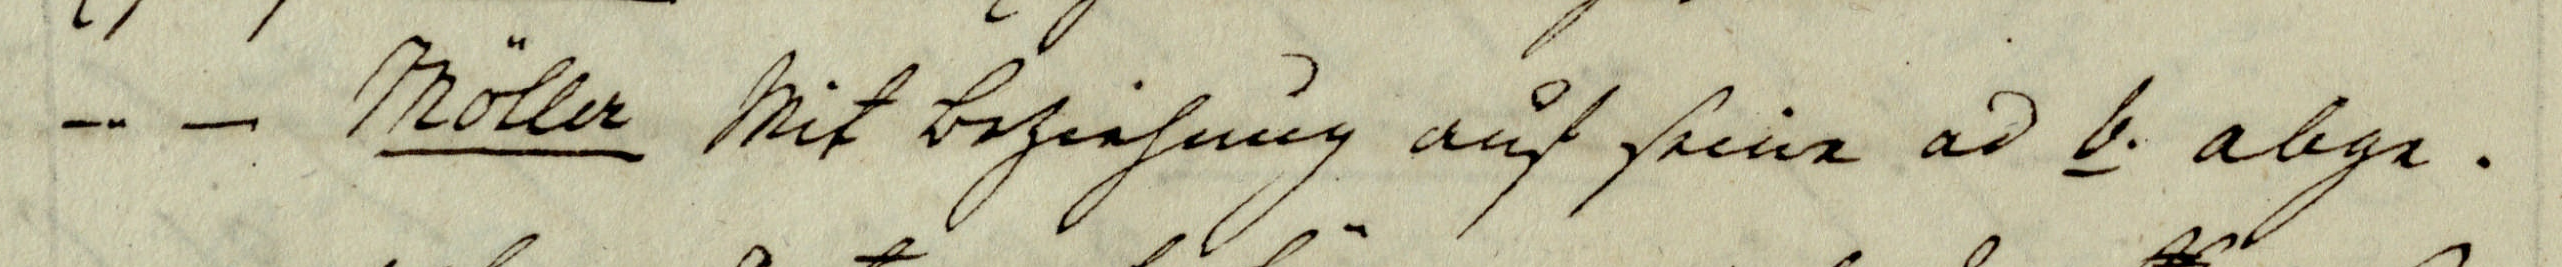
Möller. Mit Beziehung auf seine ad b. abge¬
